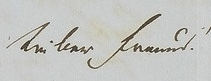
Lieber Freund!
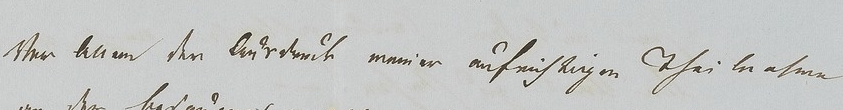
Vor Allem der Ausdruck meiner aufrichtigen Theilnahme
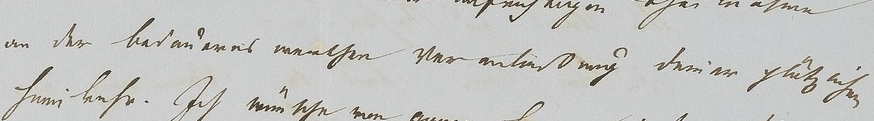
an der bedauernswerthen Veranlaßung deiner plötzlichen
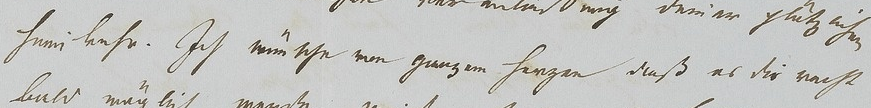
Heimkehr. Ich wünsche von ganzem Herzen daß es dir recht
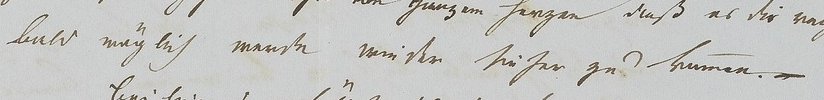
bald möglich werde wieder hieher zu kommen. –
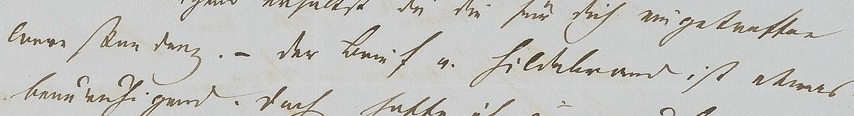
Correspondenz. – Der Brief v. Hildebrand ist etwas
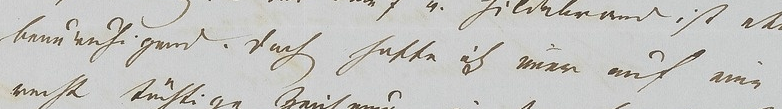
beunruhigend. Doch hoffe ich immer auf eine
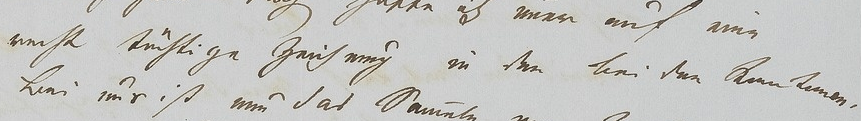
recht tüchtige Zeichnung in den beiden Kantonen.
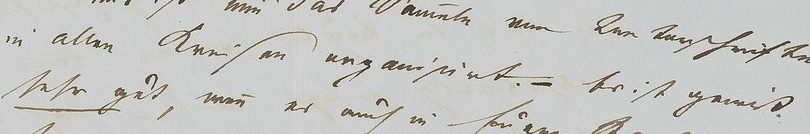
in allen Kreisen organisirt. – Es ist gewiß
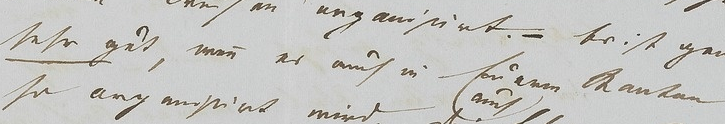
sehr gut, wenn es auch in Euerm Kanton
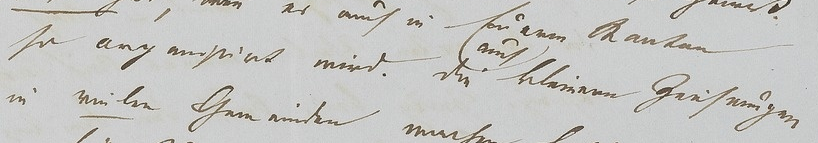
so organisirt wird. Die auch kleinern Zeichungen
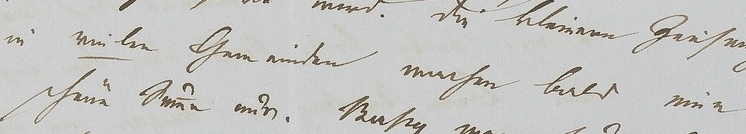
in vielen Gemeinden machen bald eine
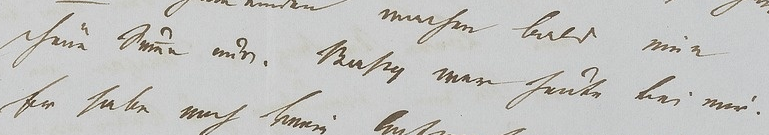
schöne Summe aus. Baßy war heute bei mir.
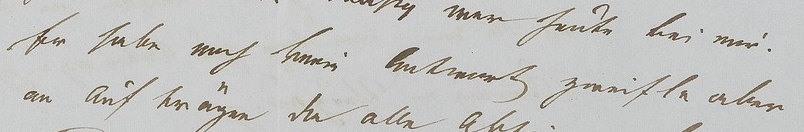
Er habe noch keine Antwort zweifle aber
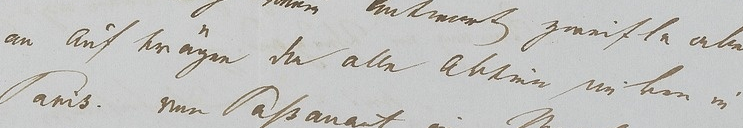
an Aufträgen da alle Aktien sinken in
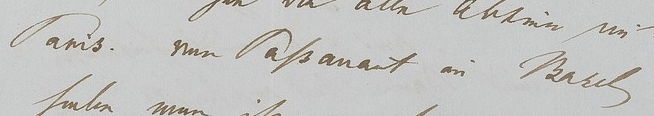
Paris. Von Passavant in Basel
